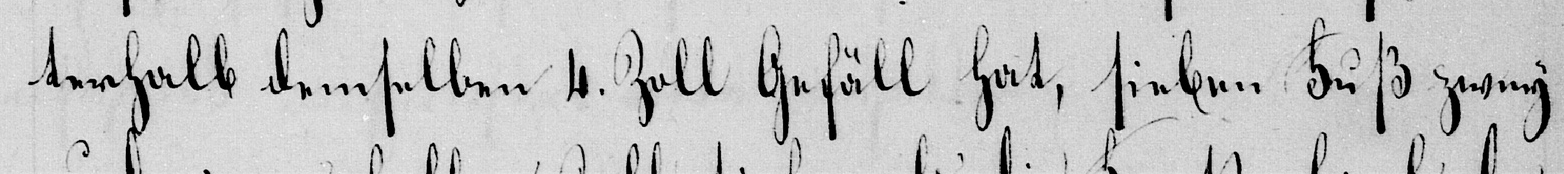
terhalb demselben 4. Zoll Gefäll hat, sieben Fuß zwey
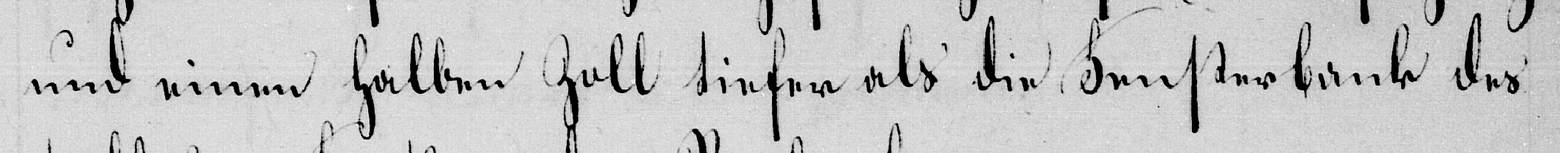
und einen halben Zoll tiefer als die Fensterbank des
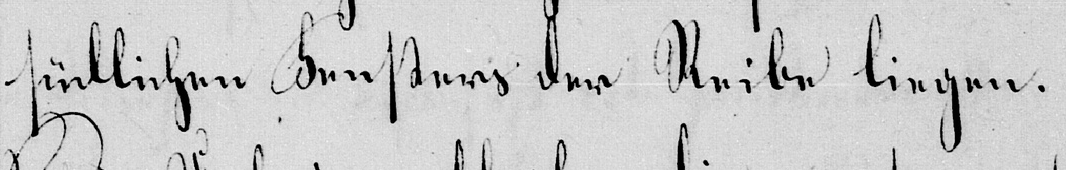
südlichen Fensters der Reibe liegen.
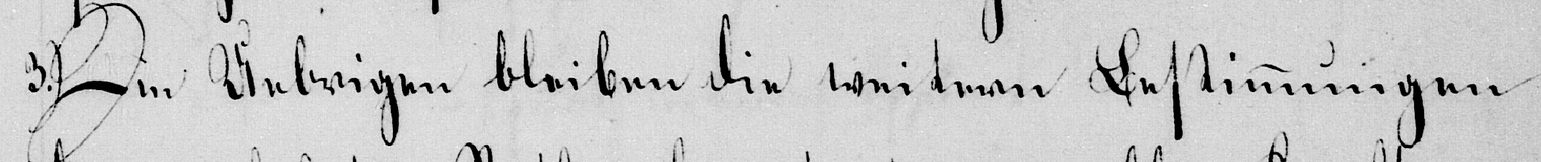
3.) Im Uebrigen bleiben die weitern Bestimmungen
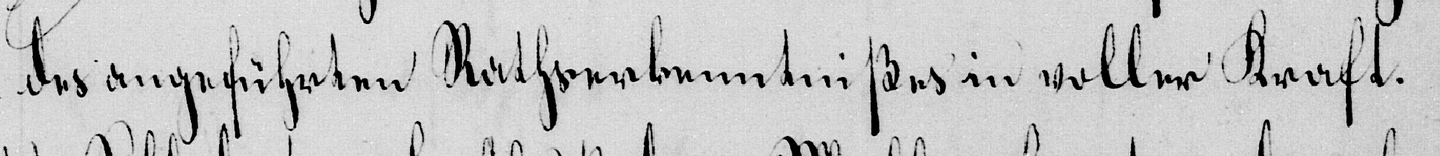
des angeführten Rathserkenntnißes in voller Kraft.
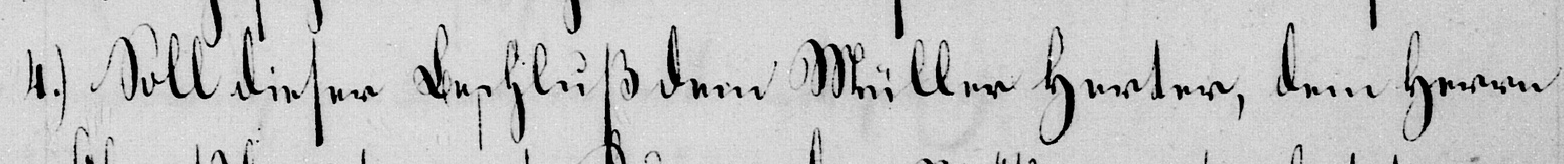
4.) Soll dieser Beschluß dem Müller Herter, dem Herrn
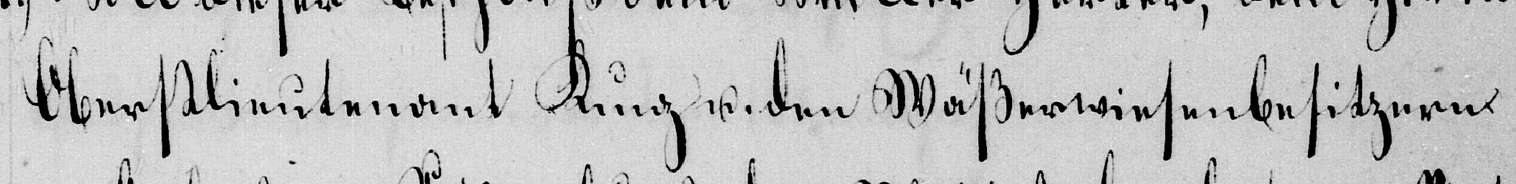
Oberstlieutenant Kunz u. den Wäßerwiesenbesitzern
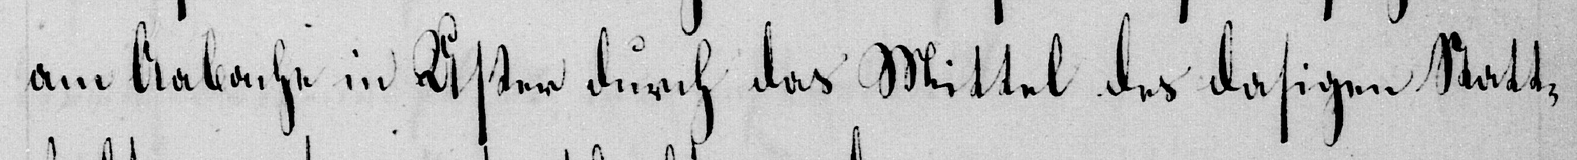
am Aabache in Uster durch das Mittel des dasigen Statt¬
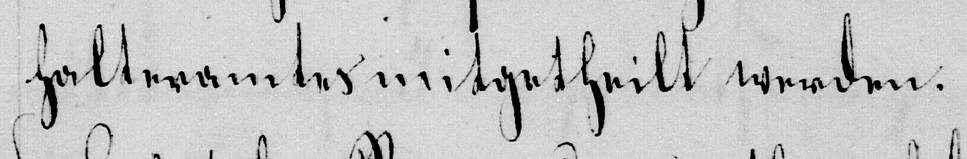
halteramtes mitgetheilt werden.
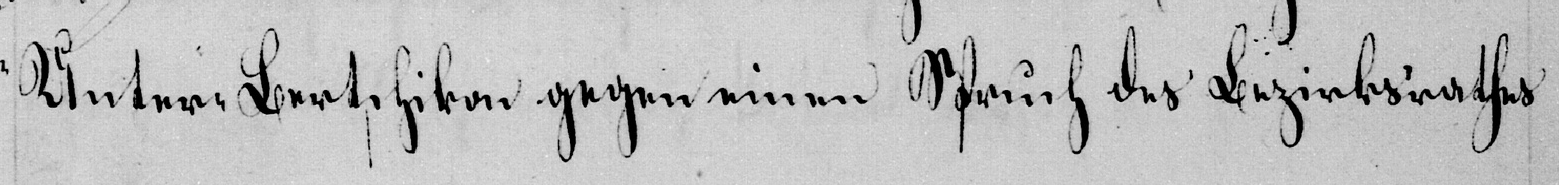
Unter-Bertschikon gegen einen Spruch des Bezirksrathes
